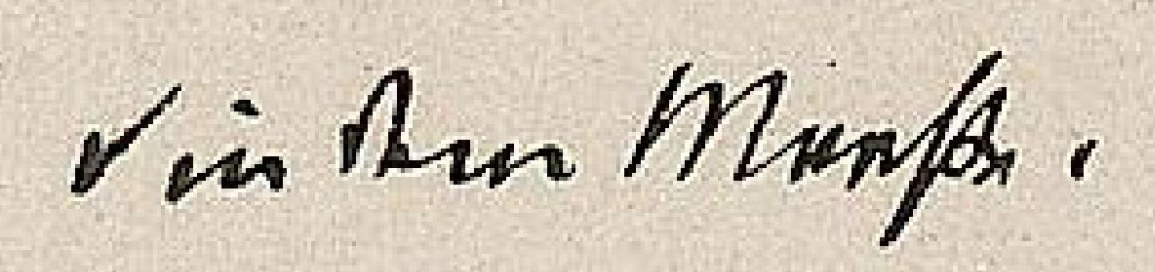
V in dem Maaße
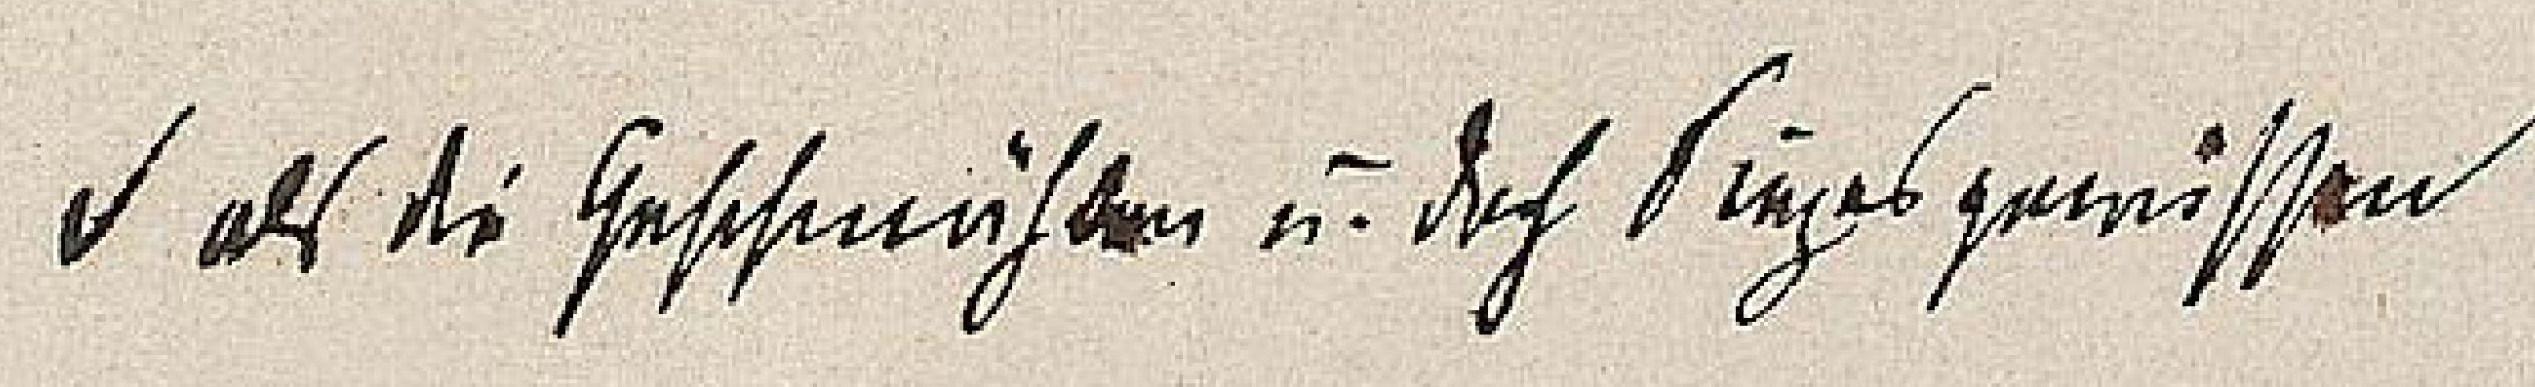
V als die Geschmähten u. doch Siegesgewissen
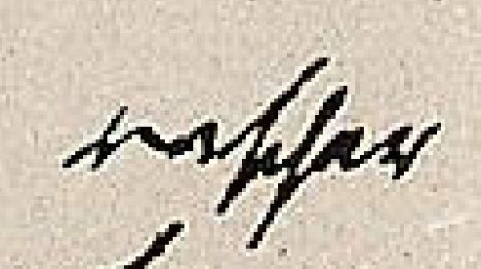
rascher
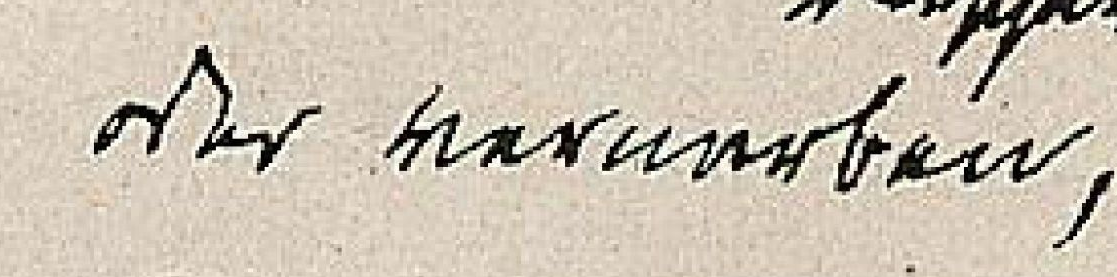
oder vernarben
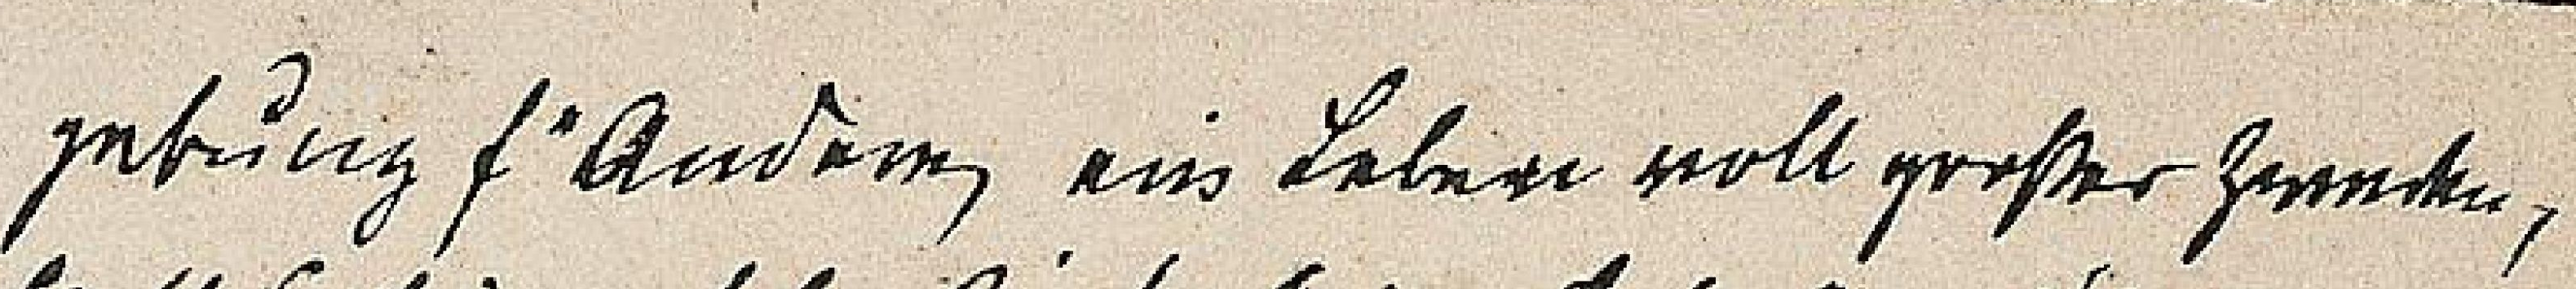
gebung fü Andere, ein Leben voll großer Zwecke,
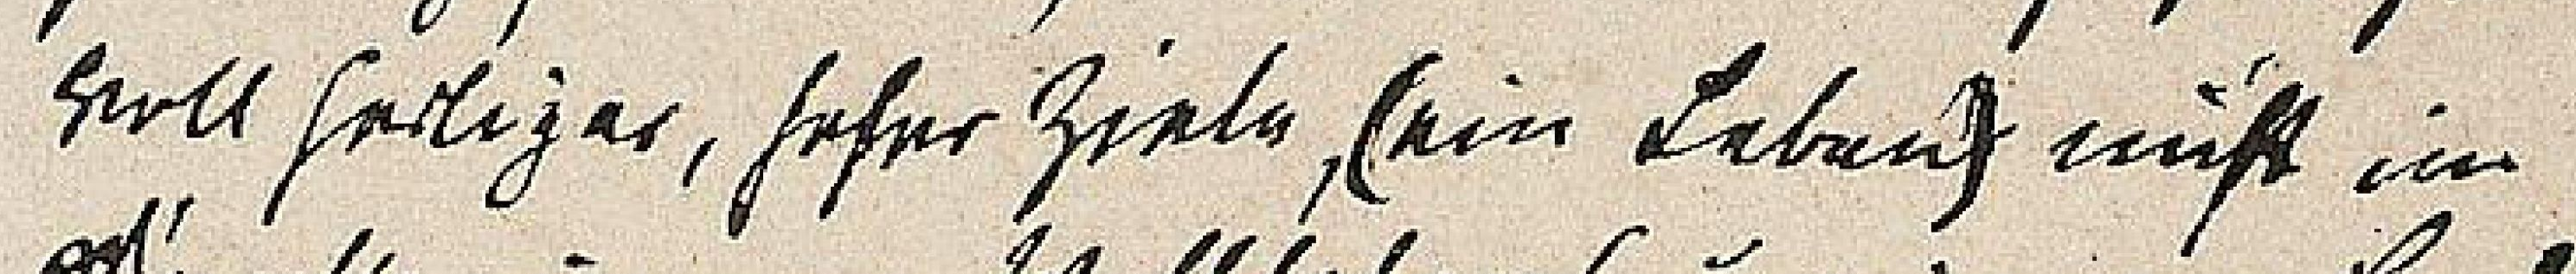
voll heilige, hoher Ziele, (ein Leben) nicht im
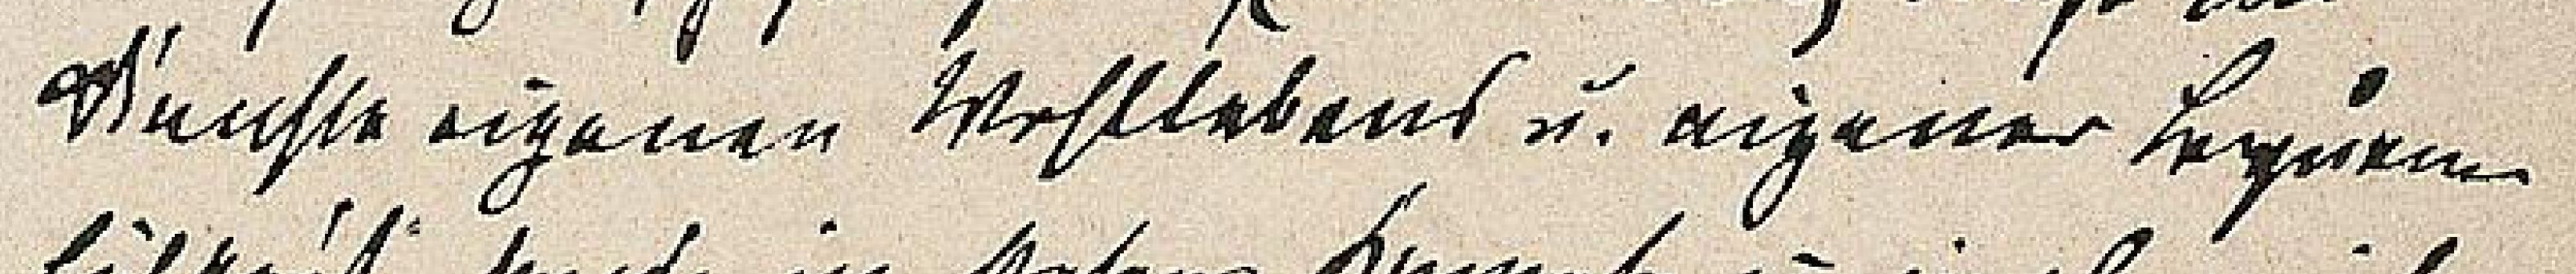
Dienste eigenen Wohllebens u. eigener Bequem¬
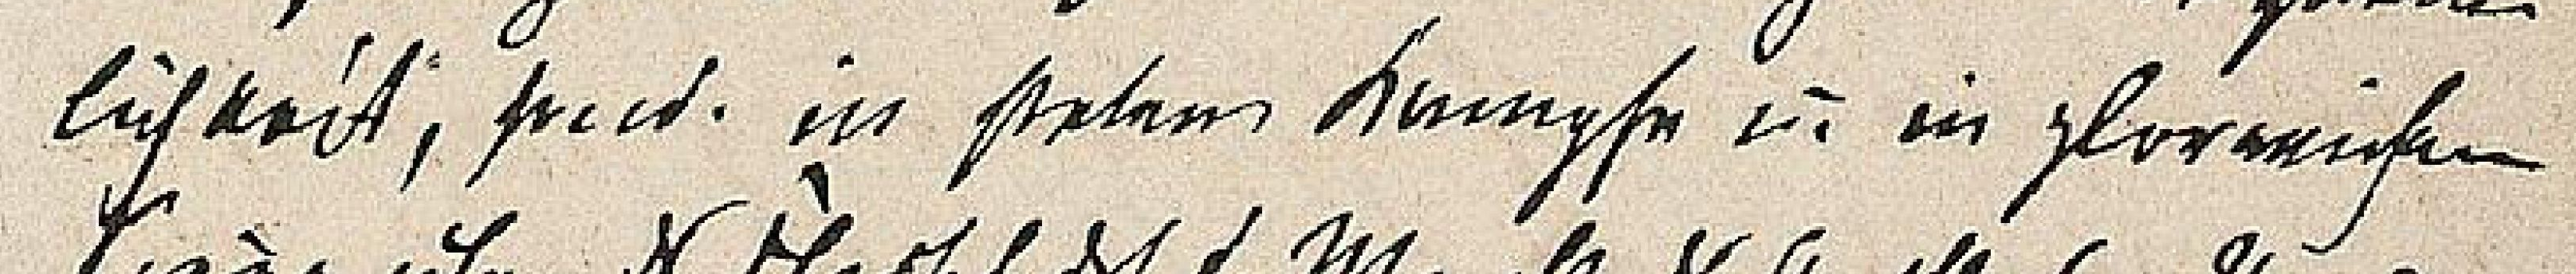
lichkeit, sond. in stetem Kampfe u. in glorreichem
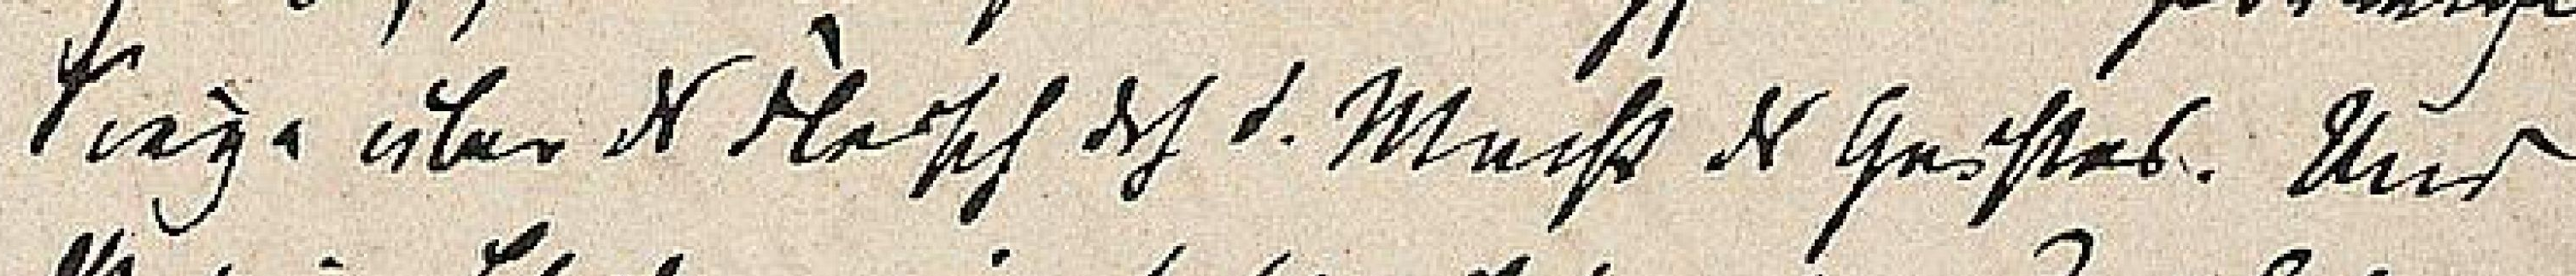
Siege über ds Fleisch dch d. Macht des Geistes. Und
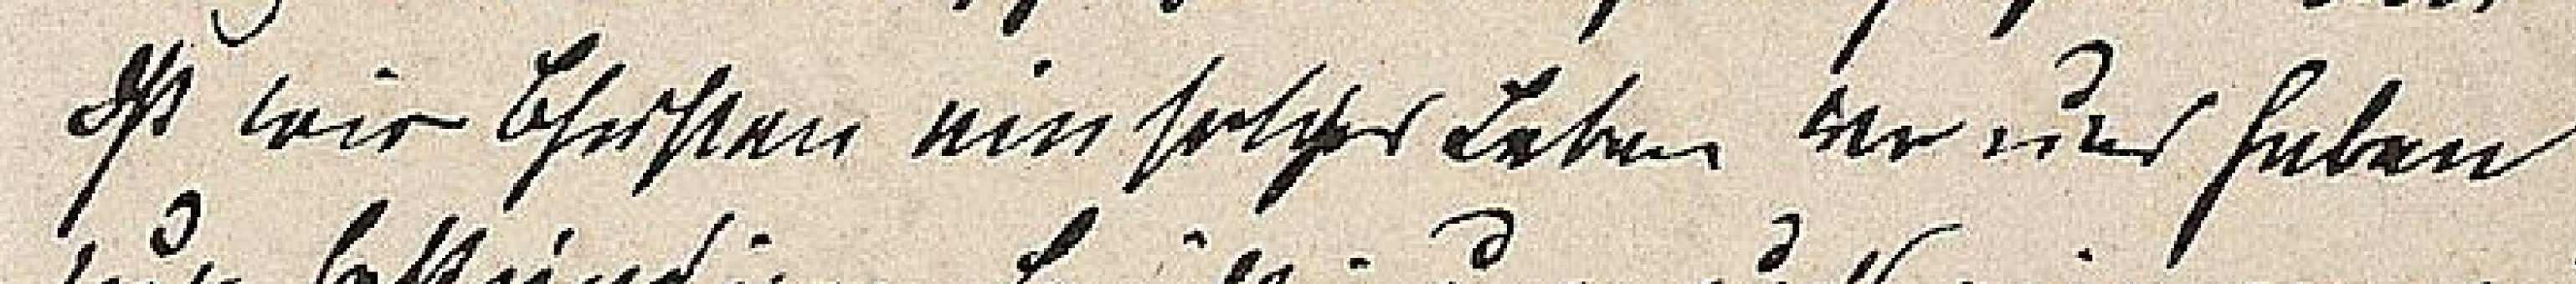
daß wir Christen ein solches Leben vor uns haben
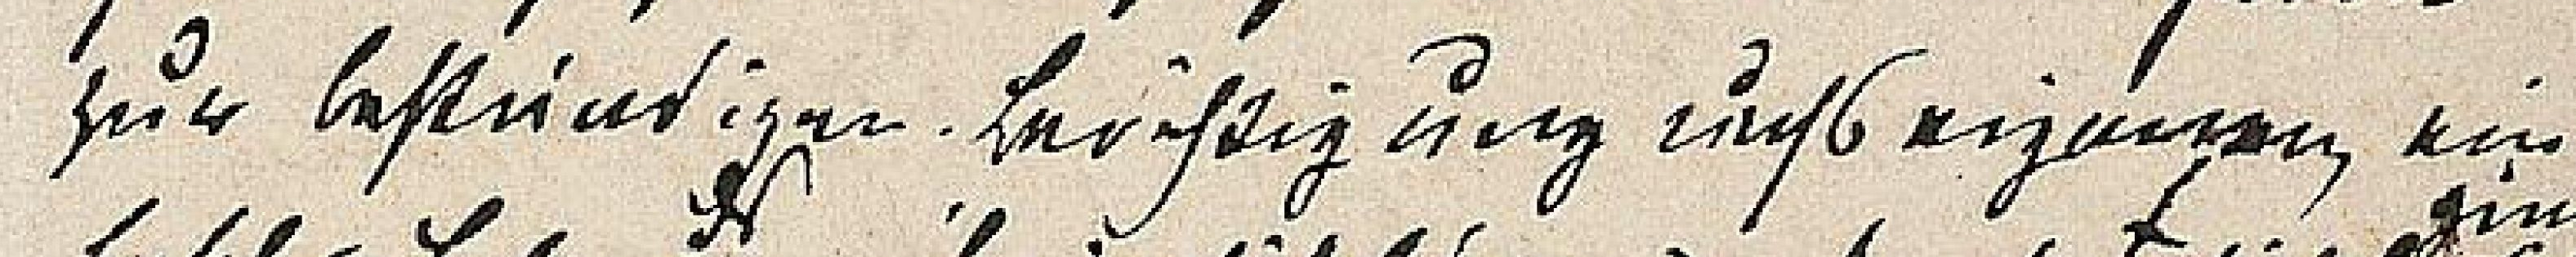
zur beständigen Berichtigung unss eigenen, ein
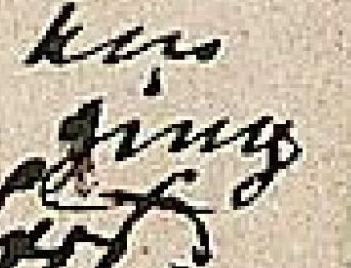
ging
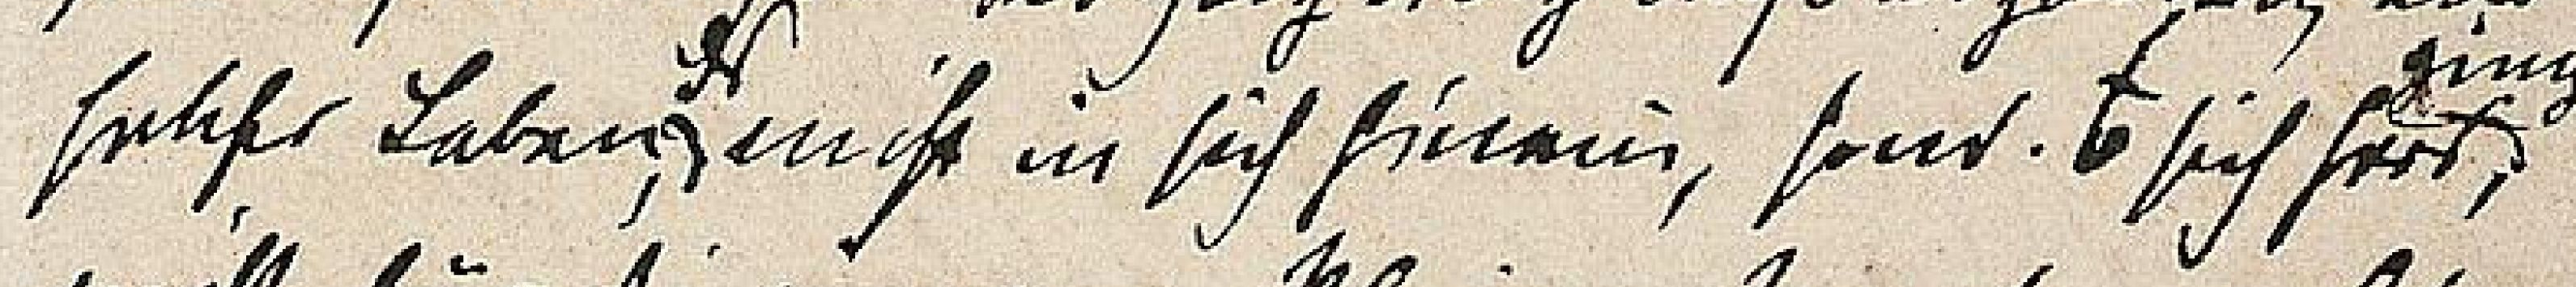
solches Leben, nicht in sich hinein, sonst s sich hers,
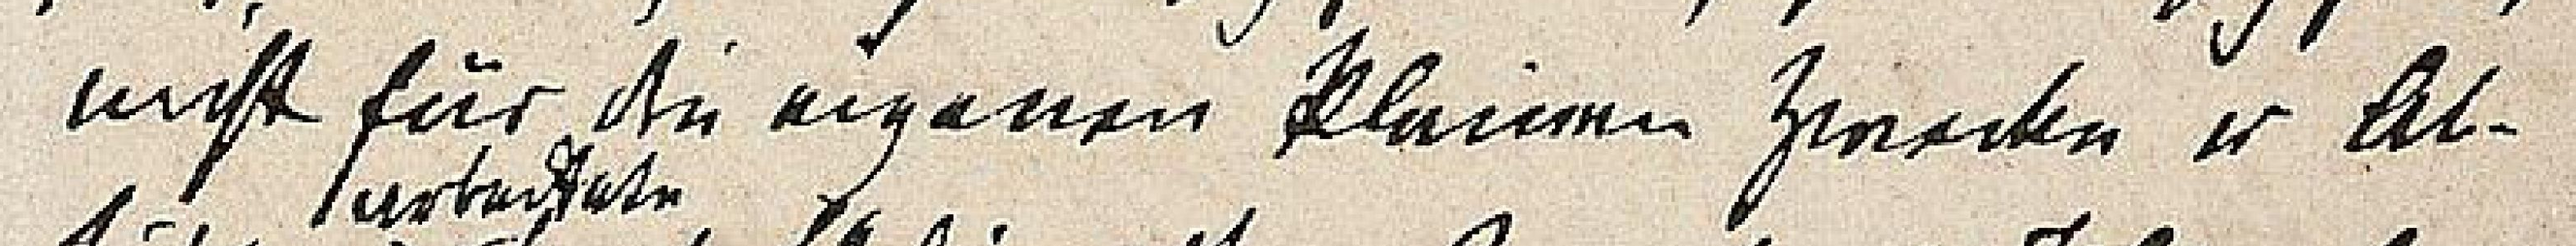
nicht für den eigenen kleinen Zwecke u. Ab¬
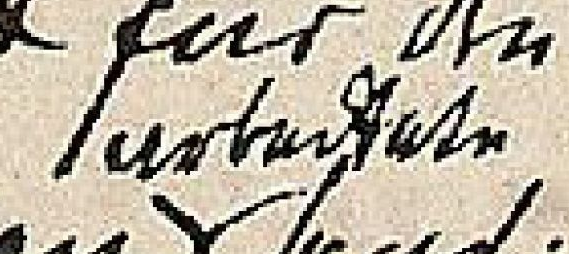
erbeutete
